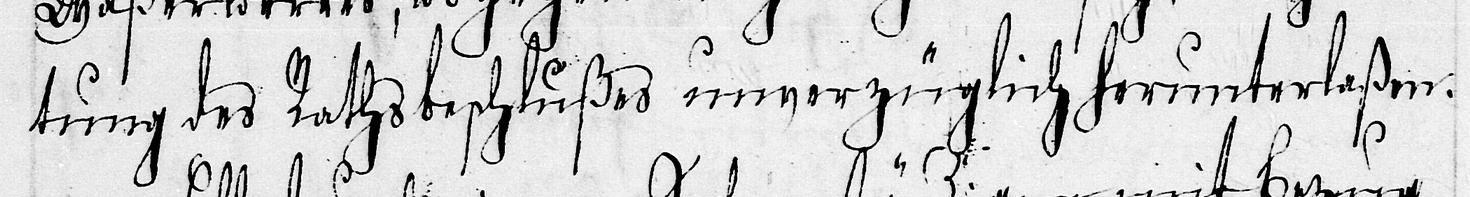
tung des Rathsbeschlußes unverzüglich herunterlaßen.
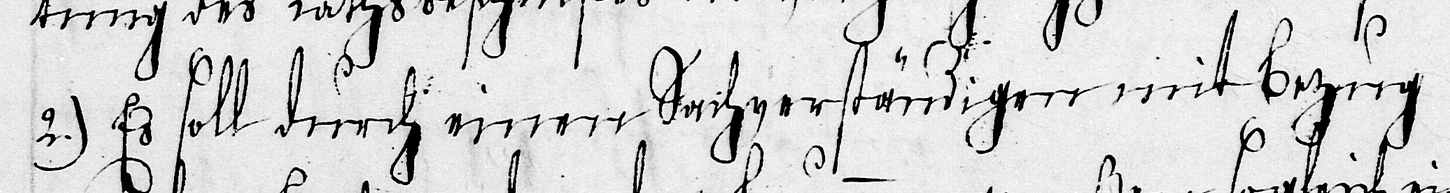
2.) Es soll durch einen Sachverständigen mit Bezug
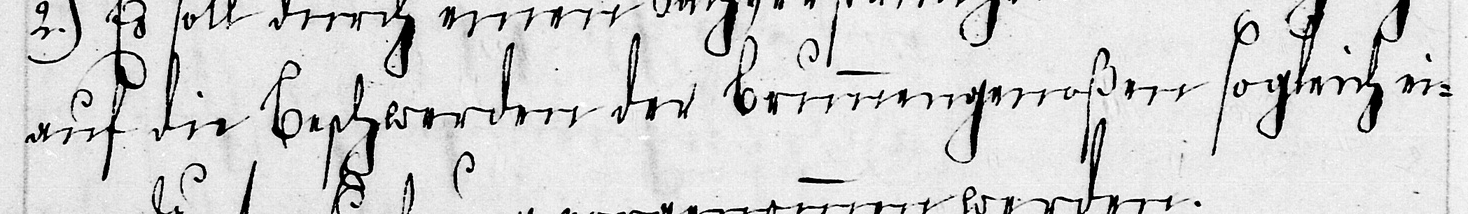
auf die Beschwerden der Brunnengenoßen sogleich ei¬
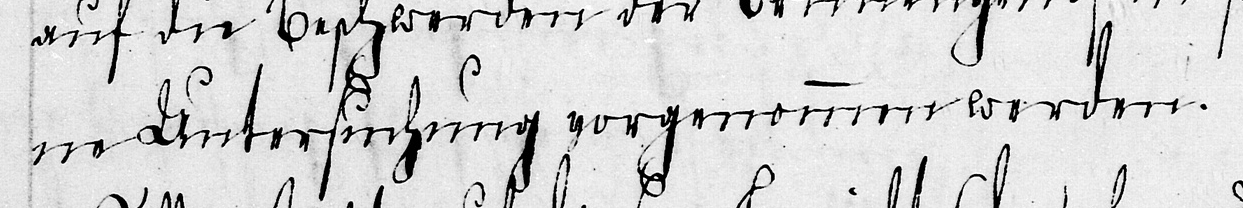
ne Untersuchung vorgenommen werden.
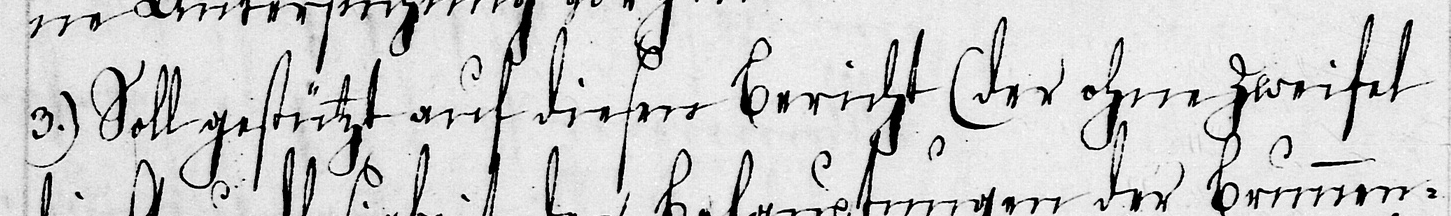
3.) Soll gestützt auf diesen Bericht (der ohne Zweifel
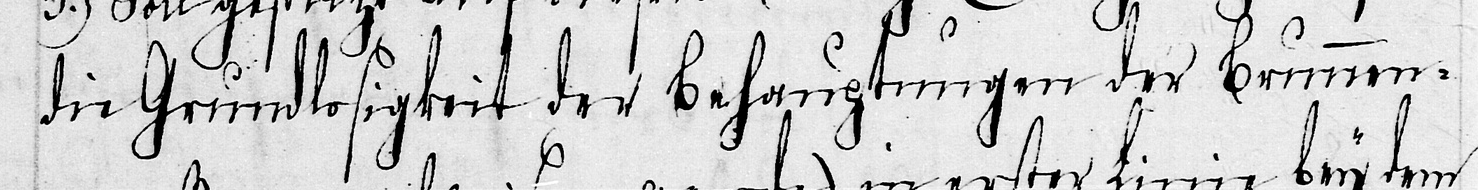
die Grundlosigkeit der Behauptungen der Brunnen¬
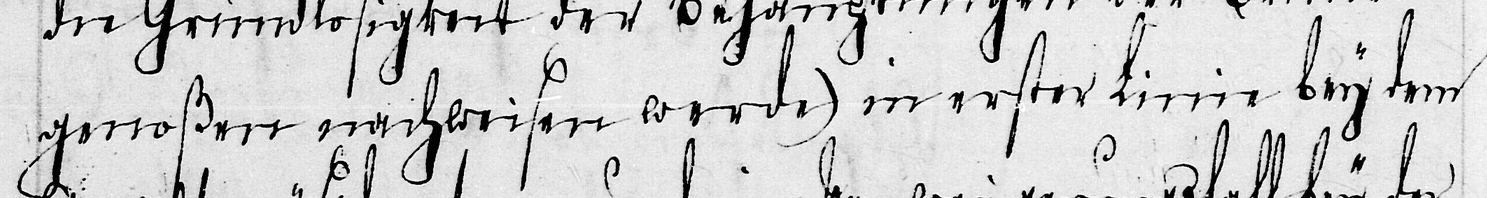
genoßen nachweisen werde) in erster Linie bey dem
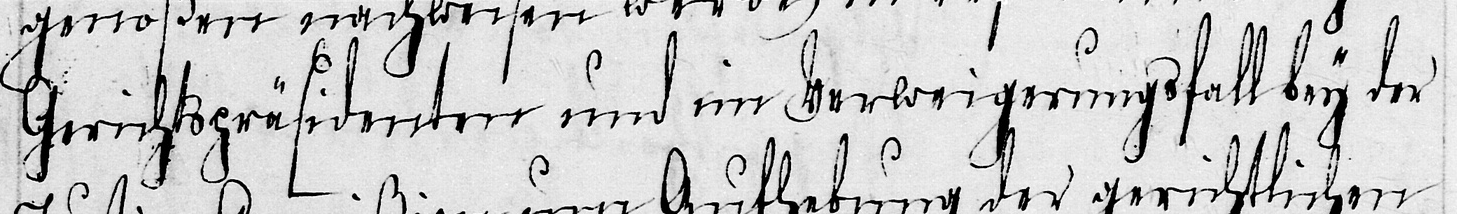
Gerichtspräsidenten und im Verweigerungsfall bey der
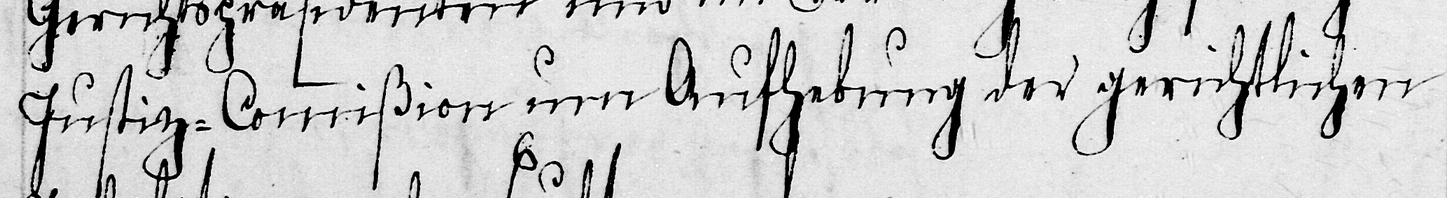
Justiz-Commißion um Aufhebung der gerichtlichen
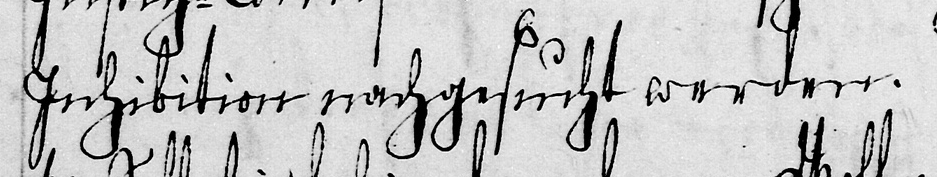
Inhibition nachgesucht werden.
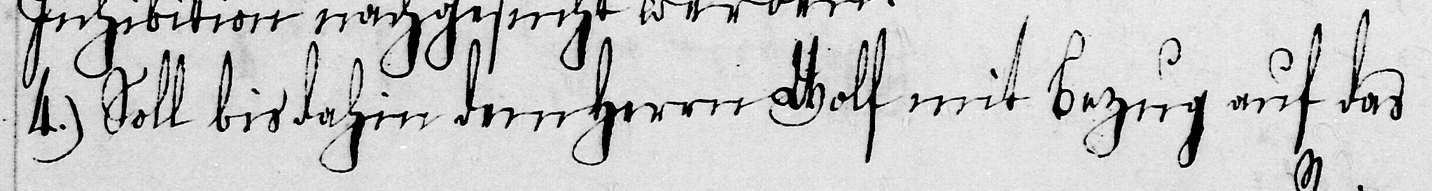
4.) Soll bis dahin dem Herrn Wolf mit Bezug auf das
